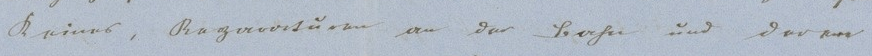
Keines, Reparaturen an der Bahn und deren
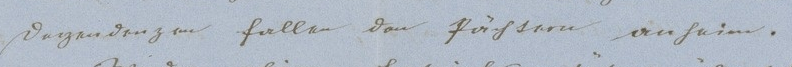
Dependenzen fallen den Pächtern anheim.
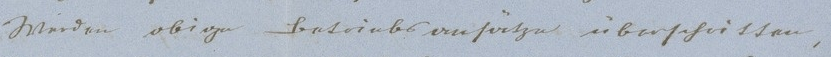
Werden obige Betriebsansätze überschritten,
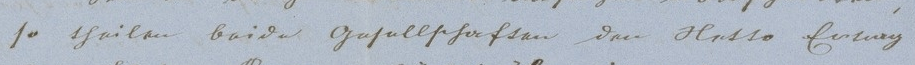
so theilen beide Gesellschaften den Netto Ertrag
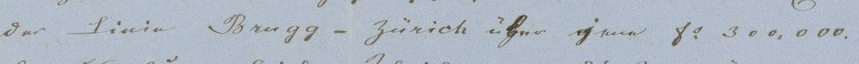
der Linie Brugg –Zürich über jene fs 300,000.–
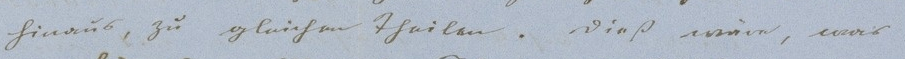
hinaus, zu gleichen Theilen. Dieß wäre, was
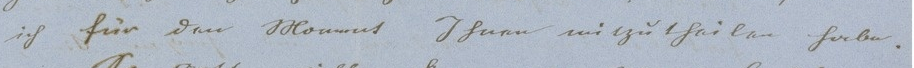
ich für den Moment Ihnen mitzutheilen habe.
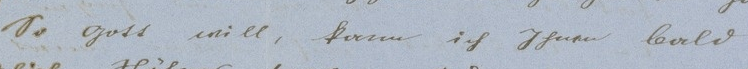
So Gott will, kann ich Ihnen bald
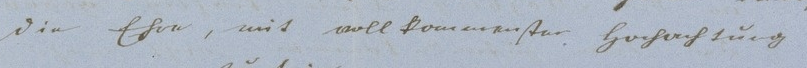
die Ehre, mit vollkommenster Hochachtung
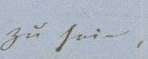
zu sein,
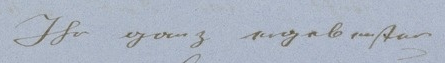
Ihr ganz ergebenster
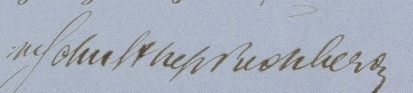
v Schultheß Rechberg
